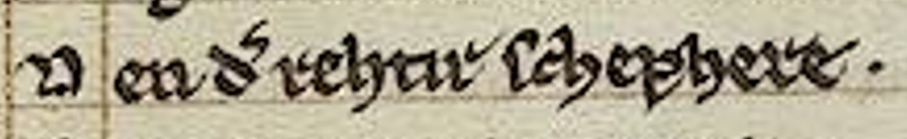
Den d(er) rehtir ſchephere.
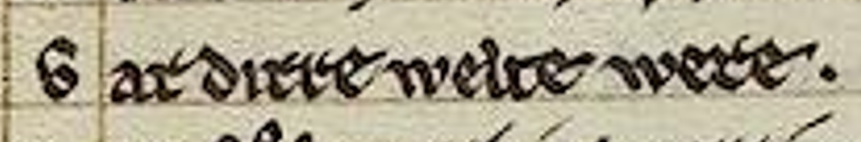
Gar dirre welte were.
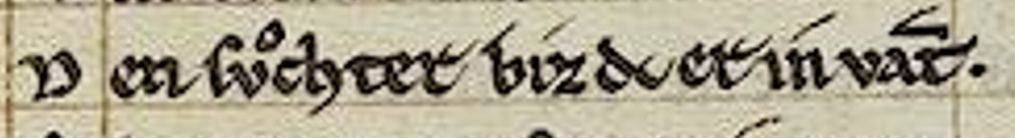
Den ſv°ochter biz d(az) er in va(n)t.
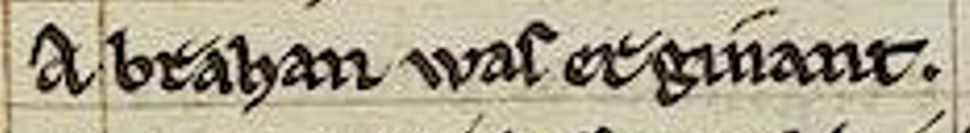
Abrahan waſ er ginant.
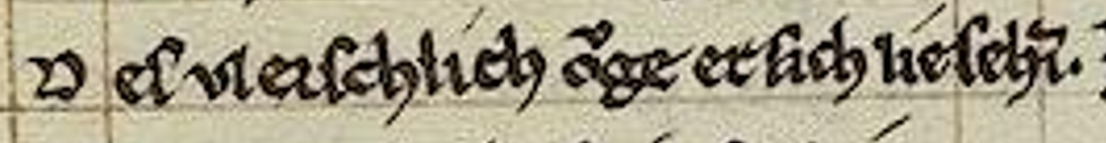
Deſ vleiſchlich o°vge er ſich lie ſehi(n).
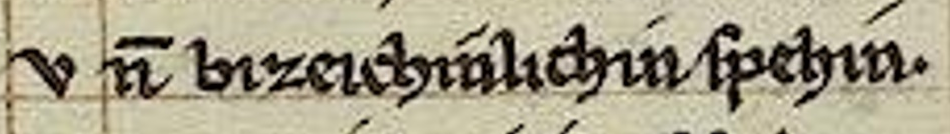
Vn(d) bizeichinlichin ſpehin.
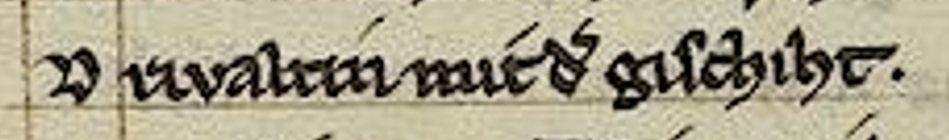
Drivaltin mit d(er) giſchiht.
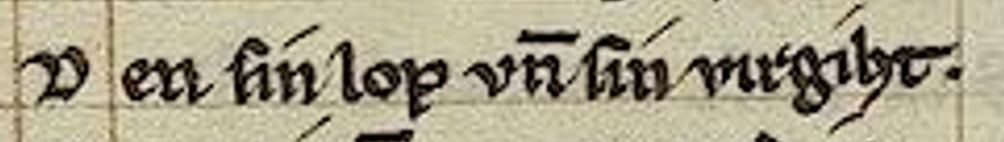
Den ſin lop vn(d) ſin virgiht.
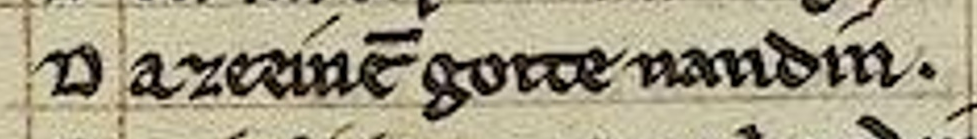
Da zeeine(m) gotte nandin.
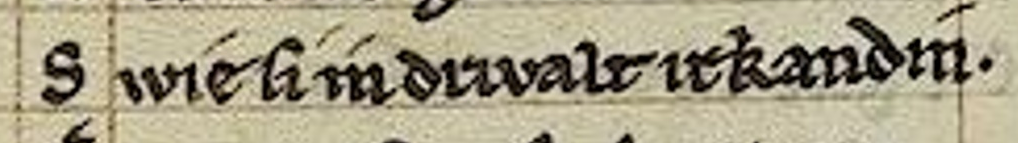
Swie ſi in drivalt irkandin.
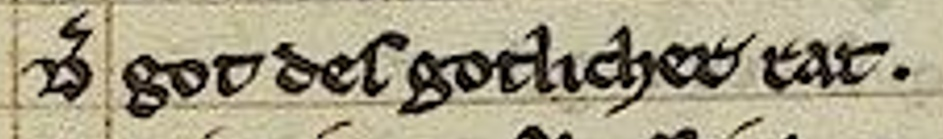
D(er) got deſ gotlicher rat.
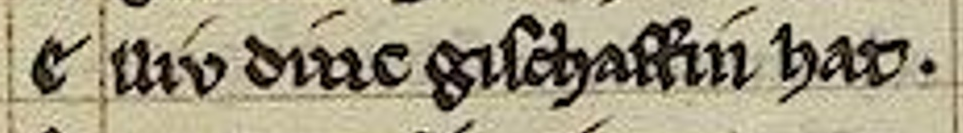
Elliv dinc giſchaffin hat.
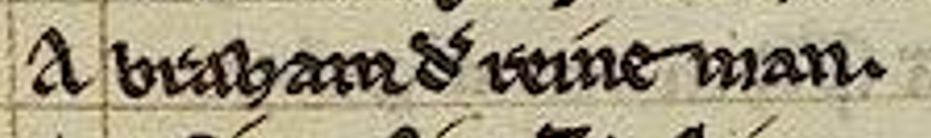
Abraham d(er) reine man.
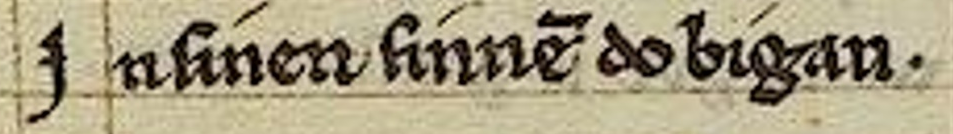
In ſinen ſinne(n) do bigan.
